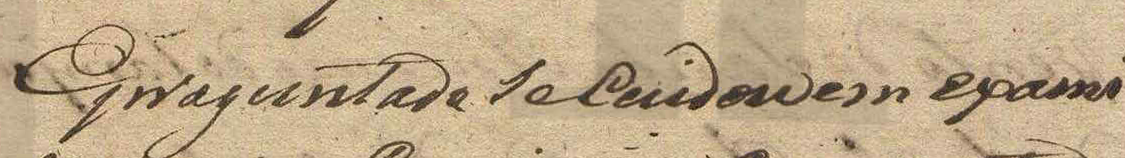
E proguntado se cuidou em exami
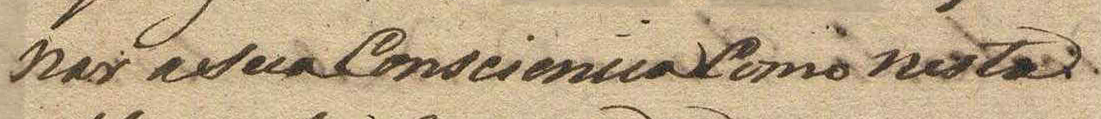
nar a sua Consciencia Como nesta
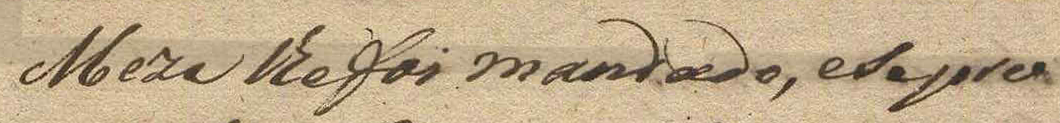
Meza lhe foi mandado, e se pro
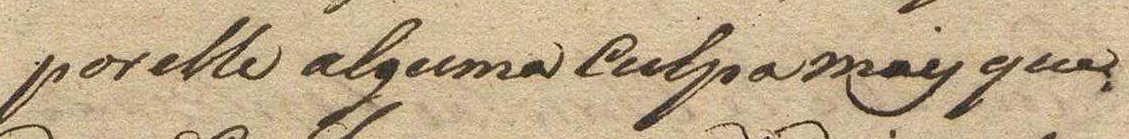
por elle alguma culpa mais que
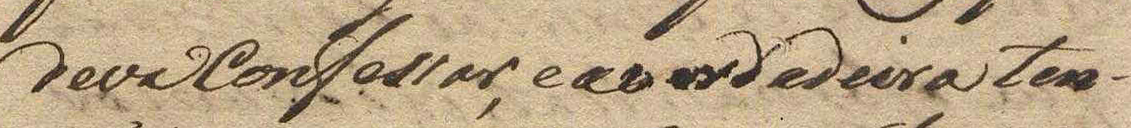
deva confessar, e a verdadeira ten
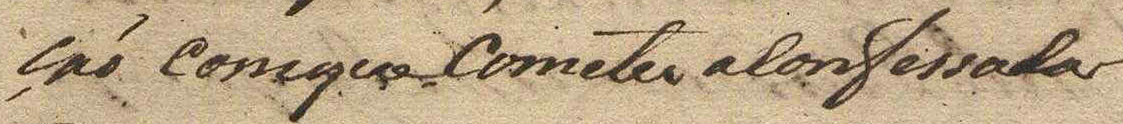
çaõ com que cometeo a confessada
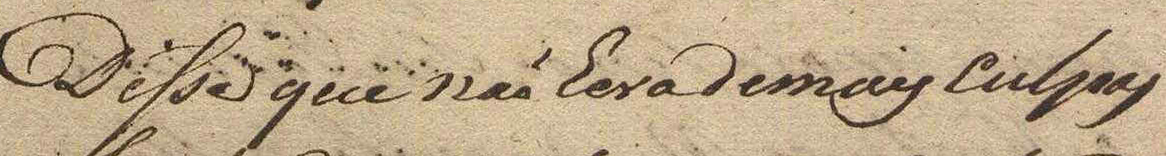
Disse que naõ hera de mais culpas
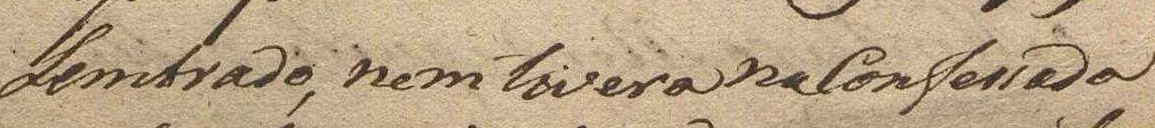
Lembrado, nem tivera na Confessada
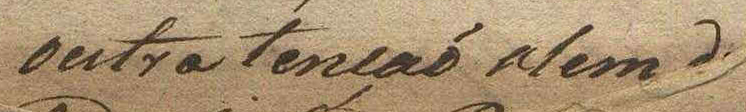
outra tençaõ alem d
